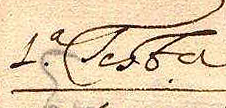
1.a Test.a
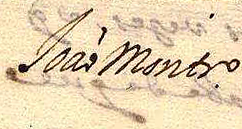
Ioaõ Montr.o
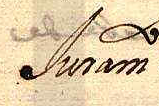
Iuram.to
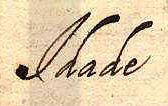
Idade
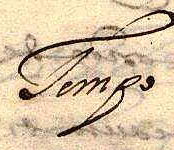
Tempo
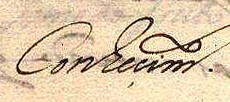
Conhecimto.
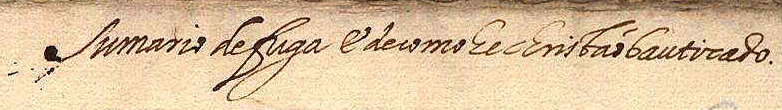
Sumario de fuga e de como he christaõ bautizado.
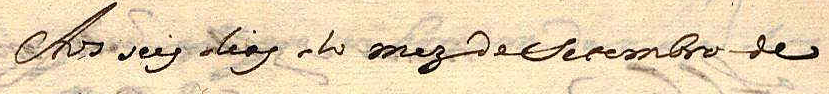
Aos seis dias do mez de Setembro de
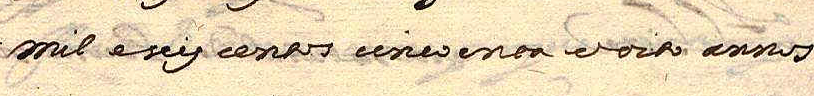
mil e seiscentos cincoenta e oito annos
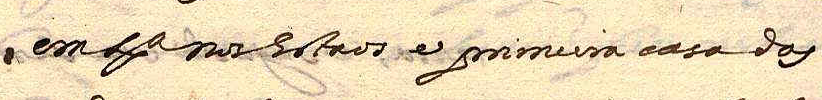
em Lxa nos Estaos e primeira casa das
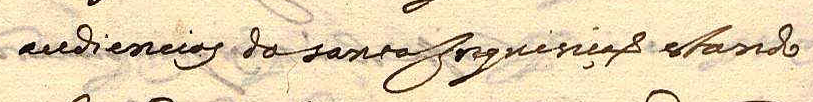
audiencias da santa Jnquisiçaõ estando
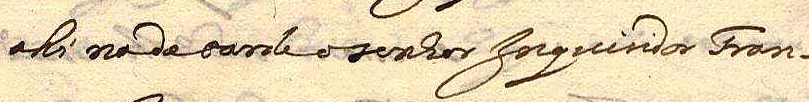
ahi na da tarde o senhor Jnquisidor Fran
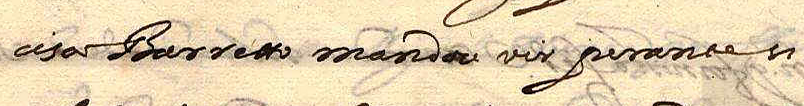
cisco Barretto mandou vir perante si
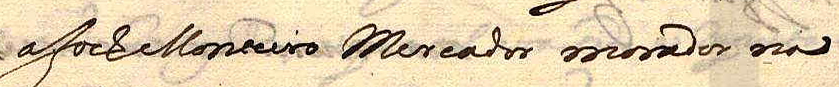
a Joaõ Monteiro Mercador morador na
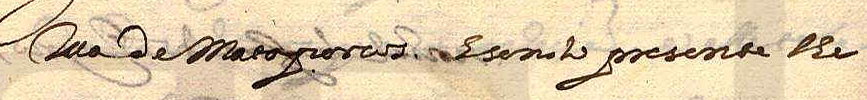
Rua de mata porcos. E sendo presente lhe
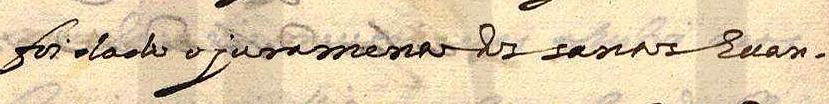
foi dado o juramento dos santos Euan
